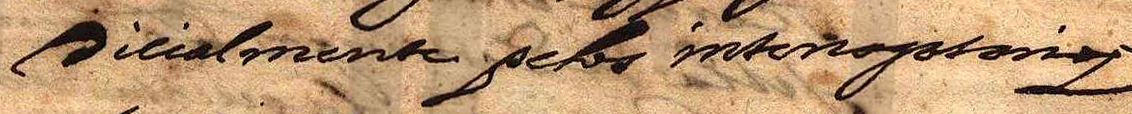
dicialmente pelos interrogatorios
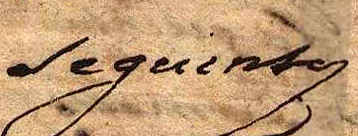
seguintes
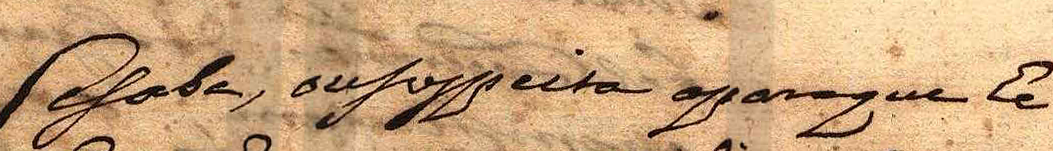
Se sabe, ou sospeita o para que he
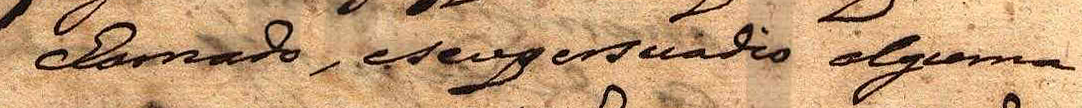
chamado, e se o persuadio alguma
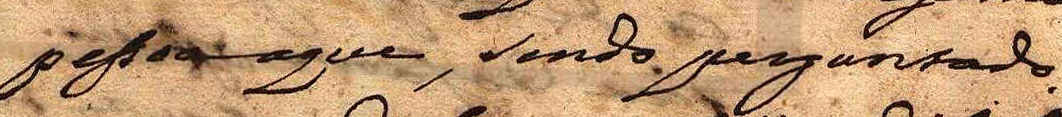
pessoa a que, sendo perguntado
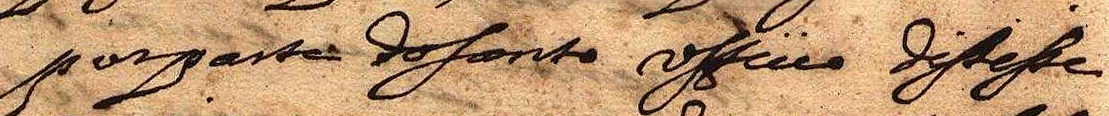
por parte do santo officio dissesse
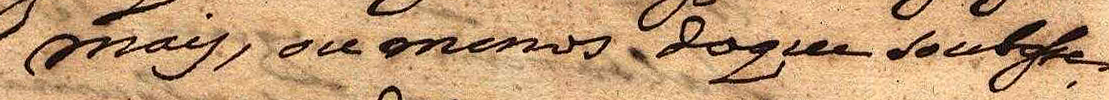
mais, ou menos do que soubesse,
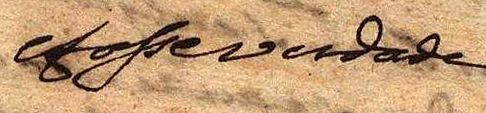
e fosse verdade
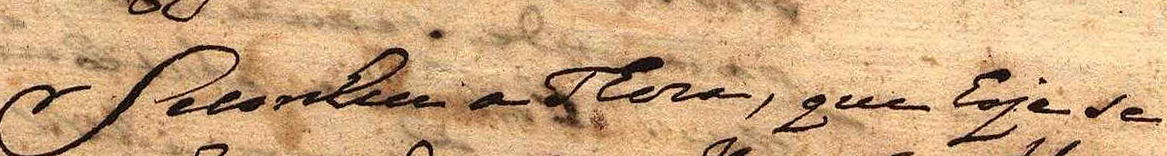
Se conhece a Theza, que hoje se
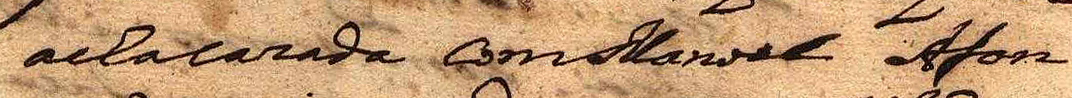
acha cazada com Manoel Afon
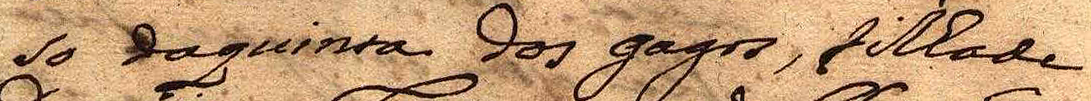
so da quinta dos gagos, filha de
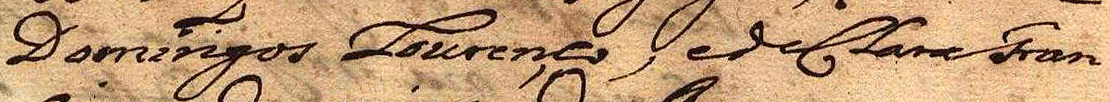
Domingos Lourenço, e de Clara Fran
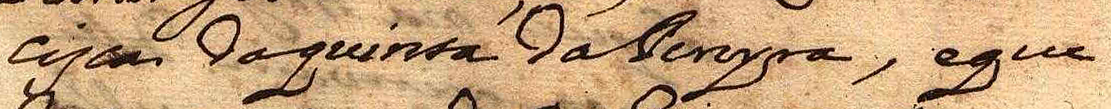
cisca da quinta da Pereyra; e que
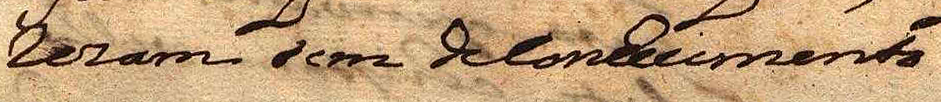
Rezam tem de conhecimento
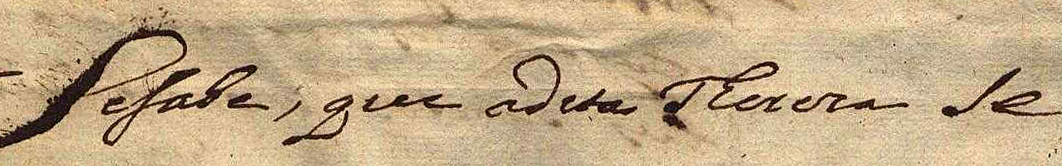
Se sabe, que a dita Thereza se
